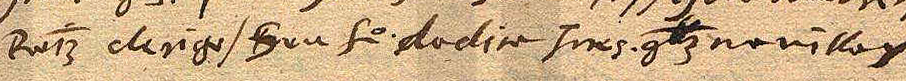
Rōiz clerigo / Seu fo. da dita Ines. gl̄lz na uilla/
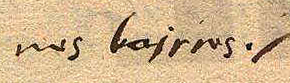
nos bajrros ./
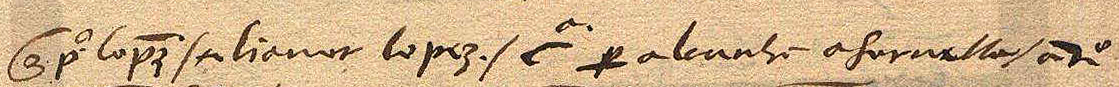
item p.o lop̄z / e lianor lopez. / Ca ꝑ alcunha a Soruella / aLo
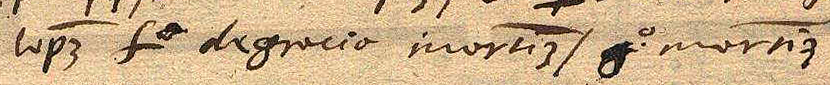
lop̄z fo de gracia martīz / g.o martīz
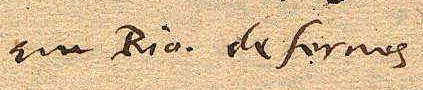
Em Rio. de fornos
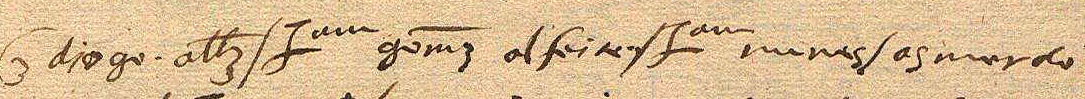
item diogo. al̄lz / Iam gōmez alfeite / Iam nunes / os mordo
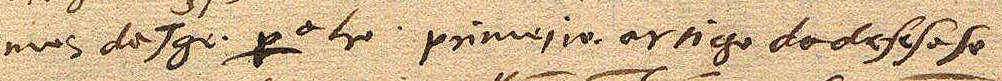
mos da Jge. ꝑa ho primejro. artigo da defesa so
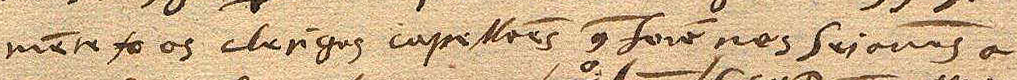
mēte e os clerigos capellães q̄ forā nos seian̄os a
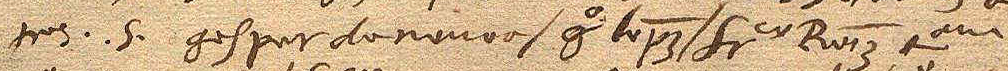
tres. .s. gaspar da nouoa / go lop̄z / frco Rōiz tam
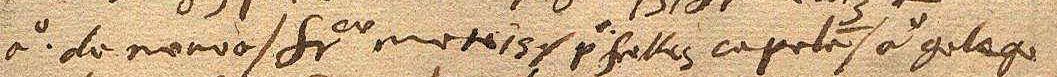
ao. da nouoa / frco morais. / po. frelles capelā / ao galego
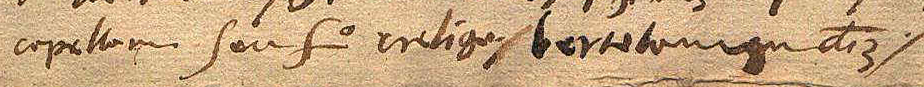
capellam seu fo creligo / bertolameu dīz. /
